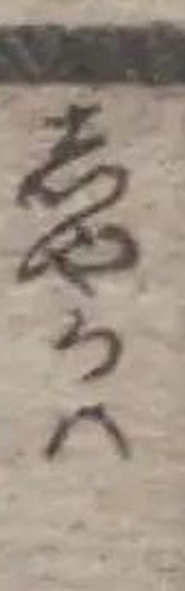しやかは
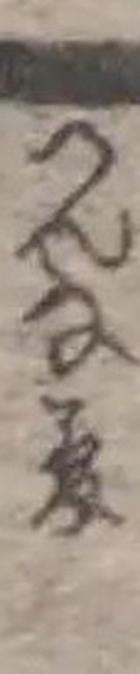へんな夢
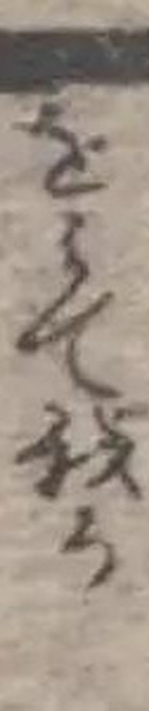をみて我か
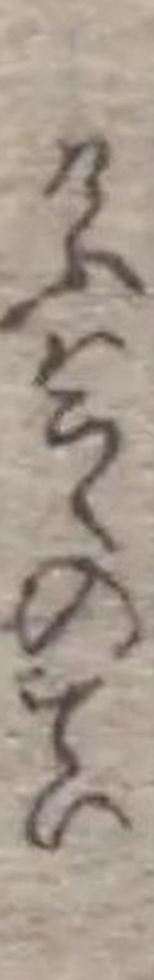けふはこゝのてい
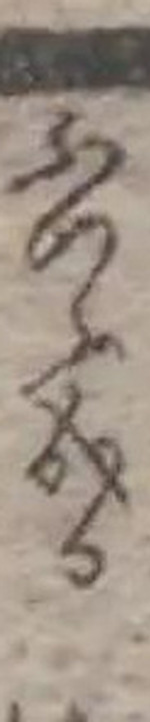ふつふ成る
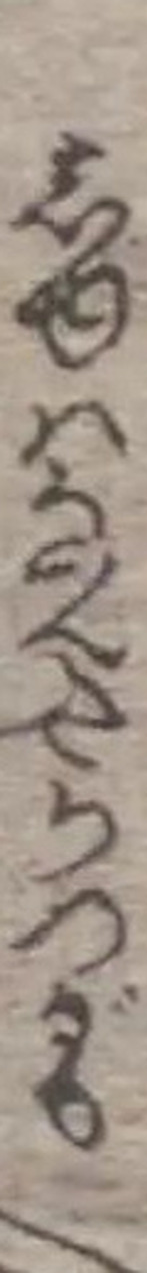しゆはなんたかつがも
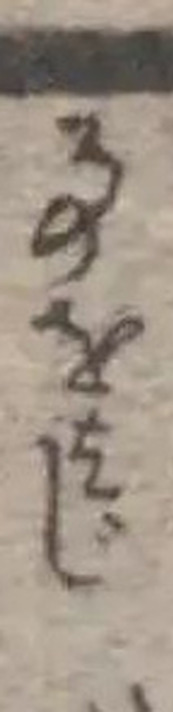事をはじ
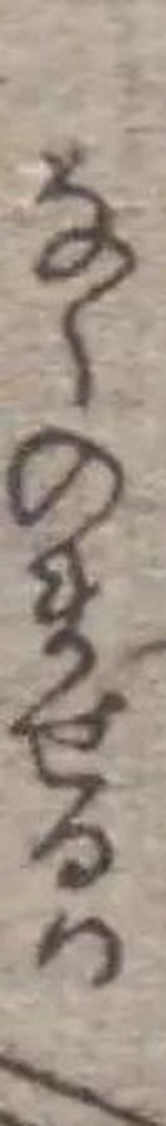なくのませるか
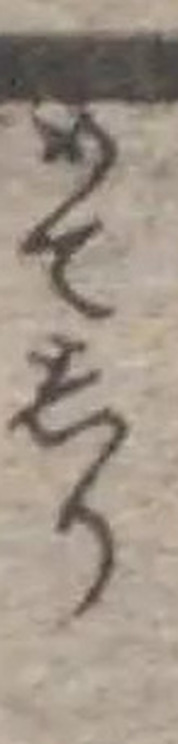めてしり
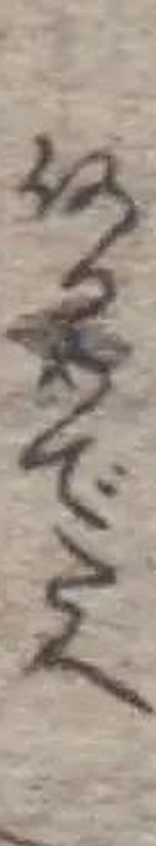何かめでたへ
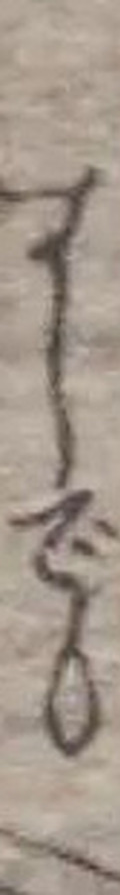すしでも
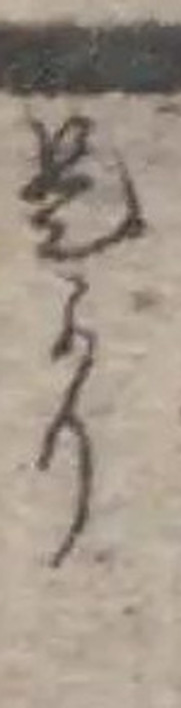是より
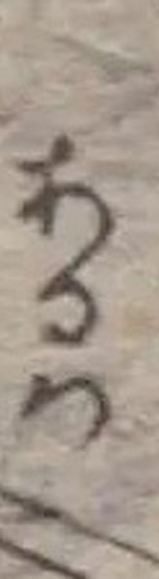あるか
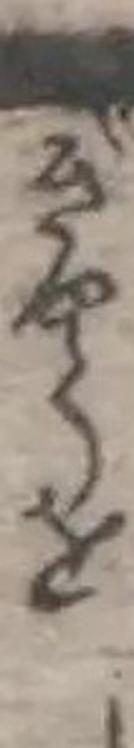ぎやうを
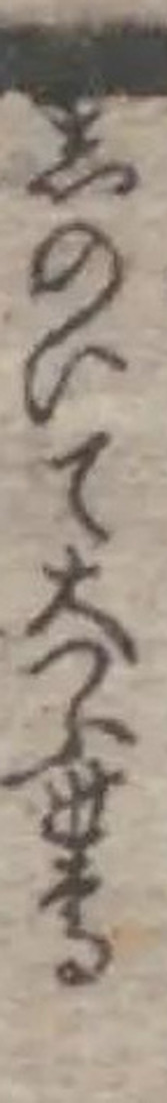しのいて大つふ世尊
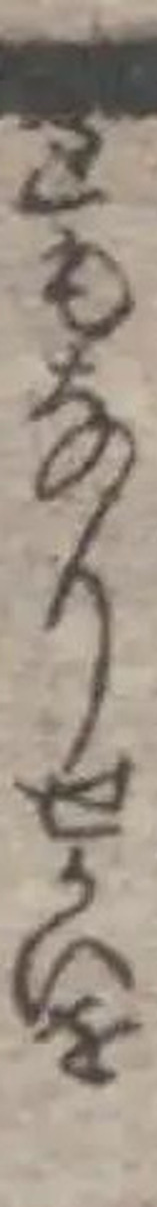ともなりせかいを
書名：早出来 3巻
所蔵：国立国会図書館 National Diet Library, JAPAN
